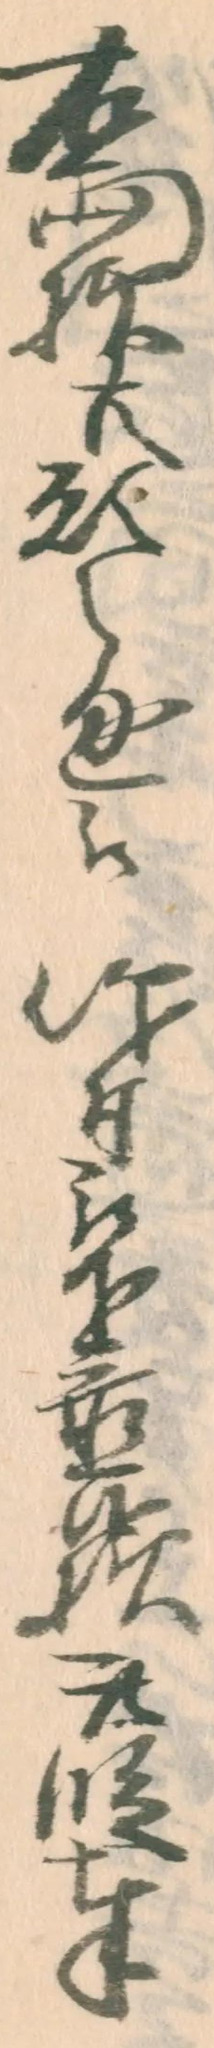右両様共願之通被仰付被下置候様此段奉
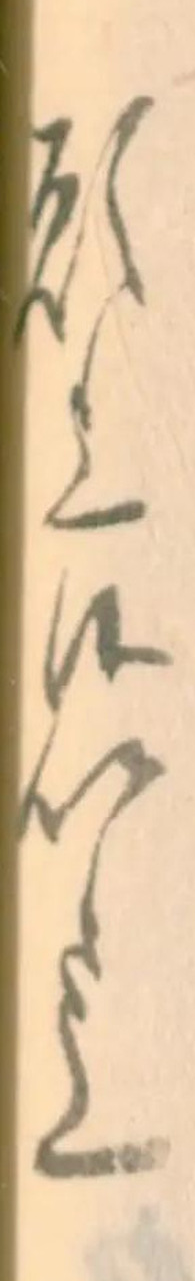願上候以上
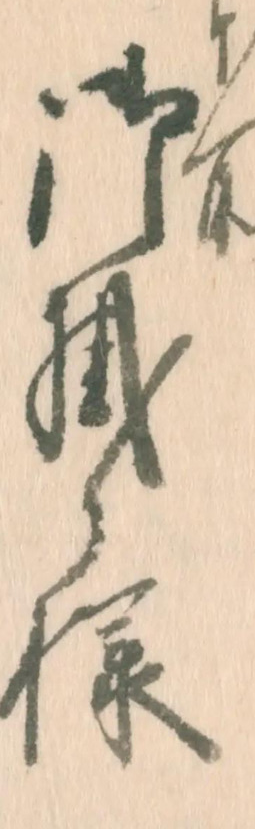御掛り様

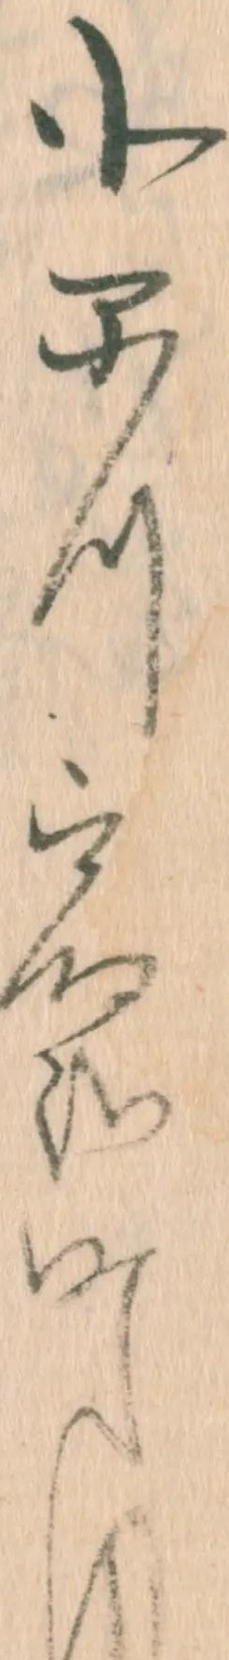北品川宿弐町内
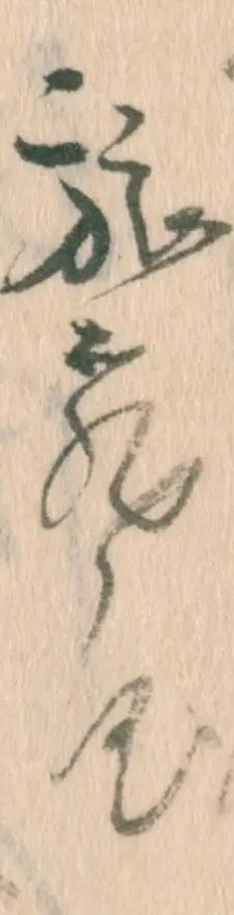旅籠屋
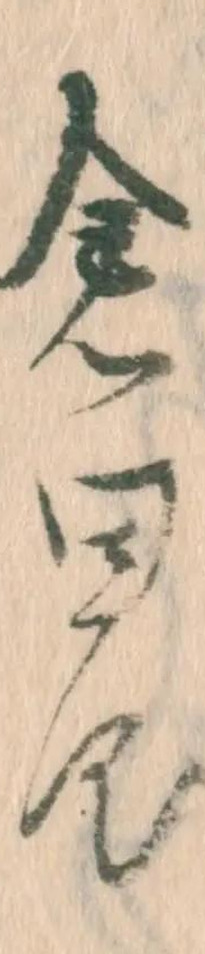倉田屋
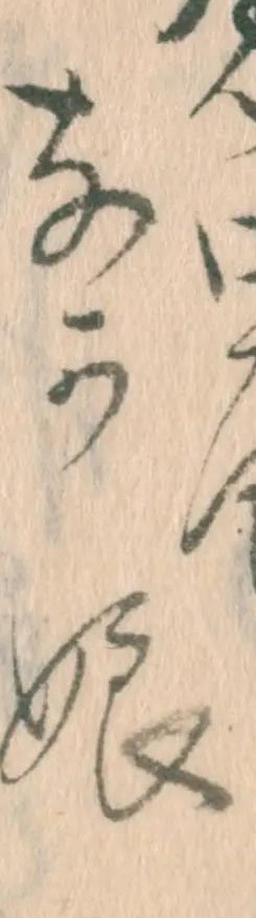なか娘
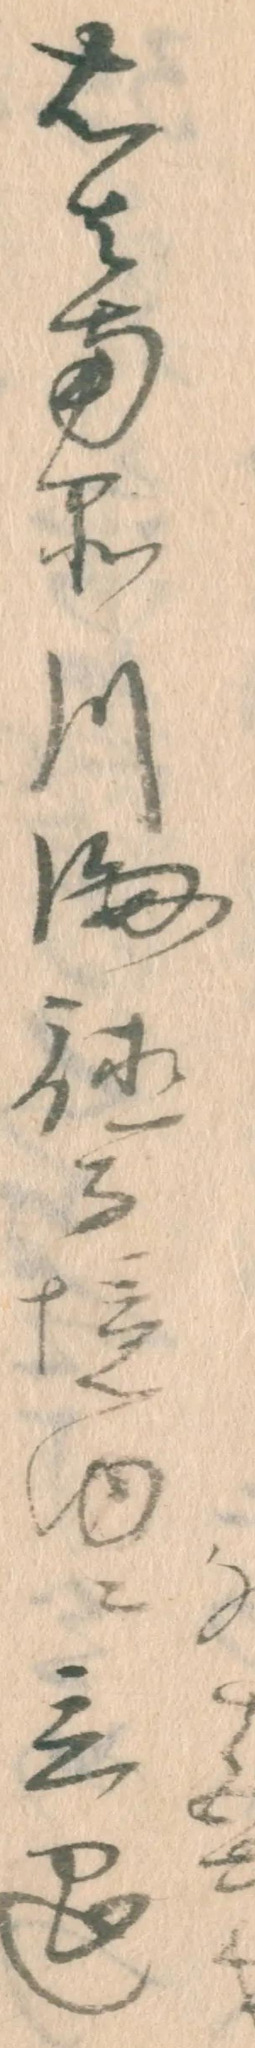右は南品川海徳寺境内ニ立退
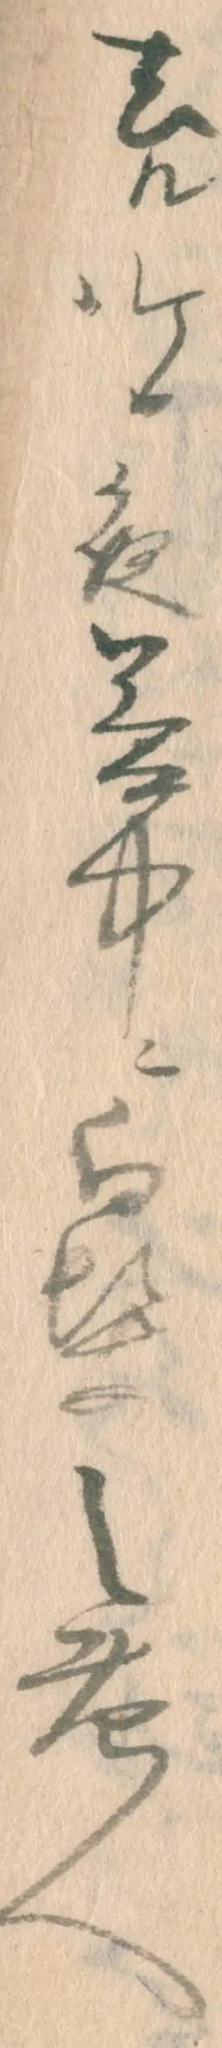去ル八日夜夢中ニ白髪之老人

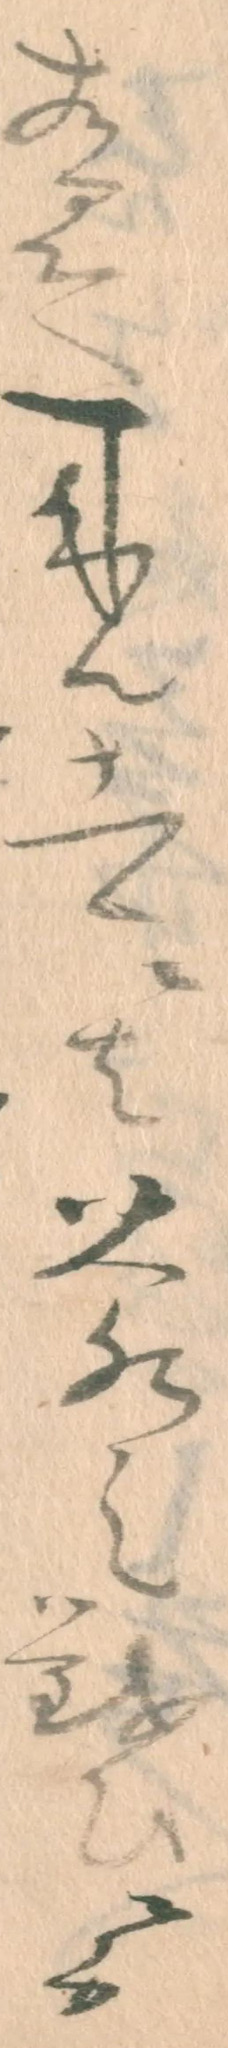相見へ来ル十一日ニは火水之戦ひニ而
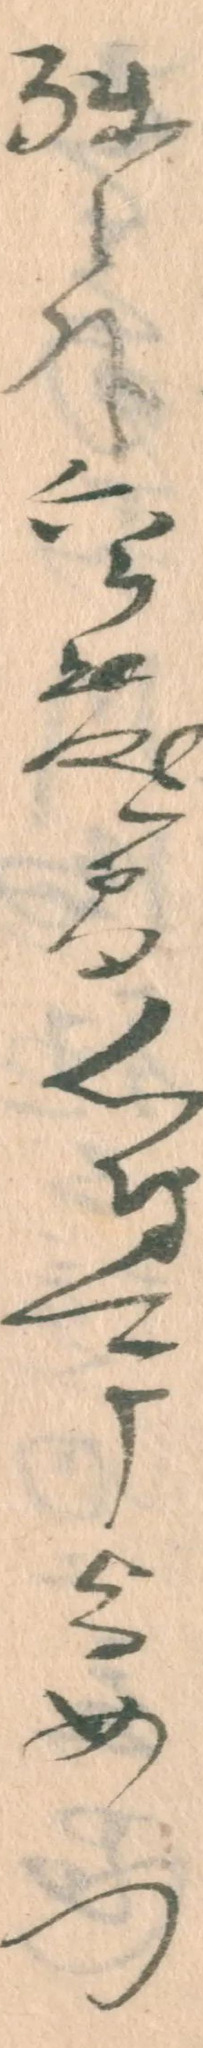殊之外六ケ敷候間心付可申旨めつ
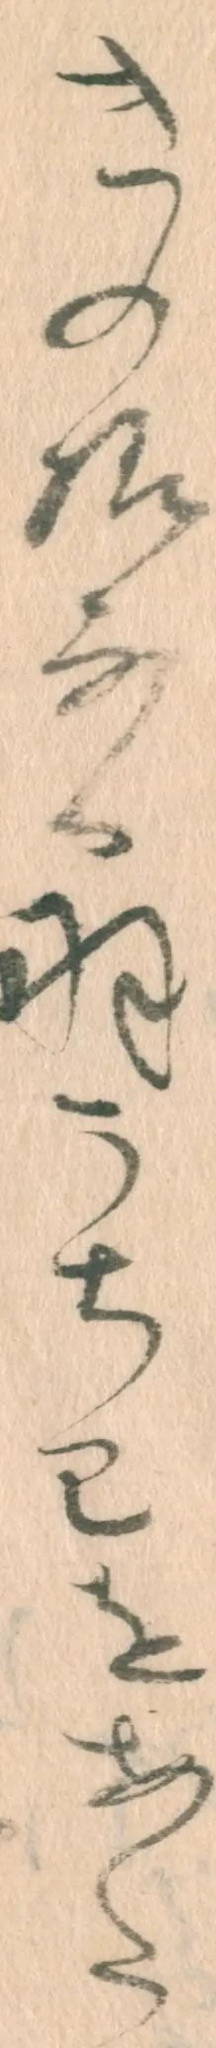きの様なる羽うちわをあたへ
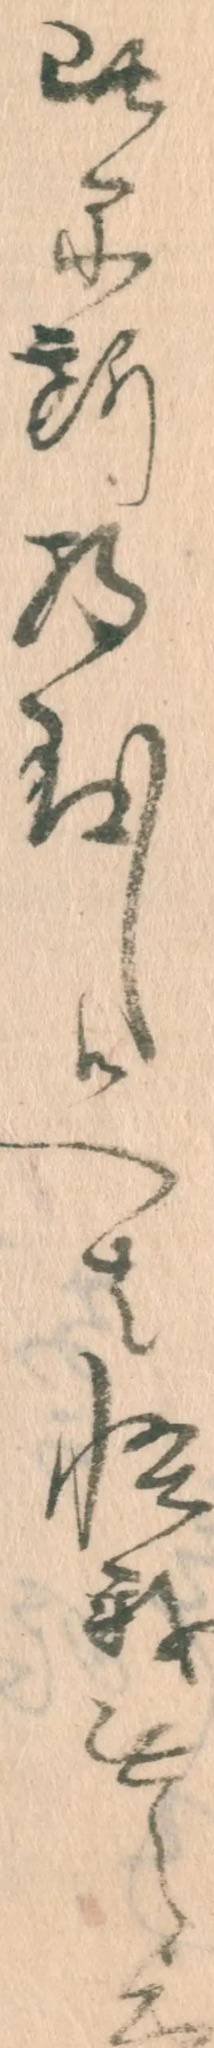此品所持致候へは怪我無之旨
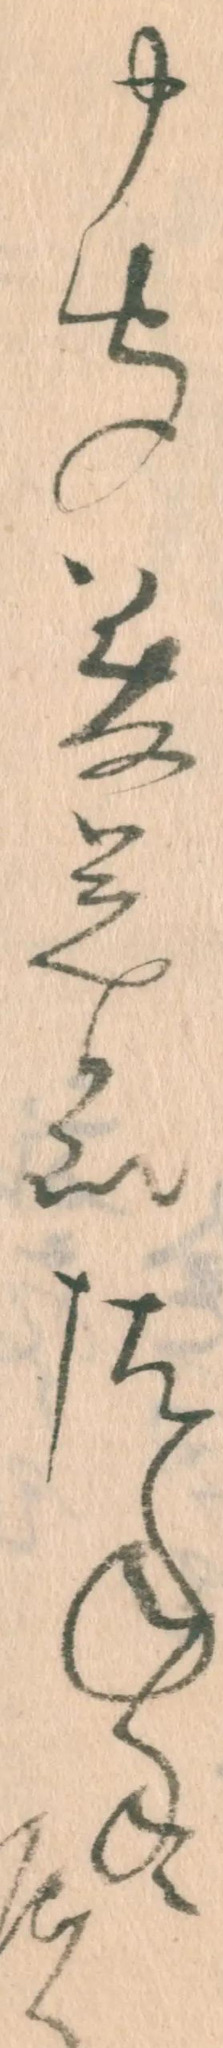申聞夢覚候処つね手ニ振り
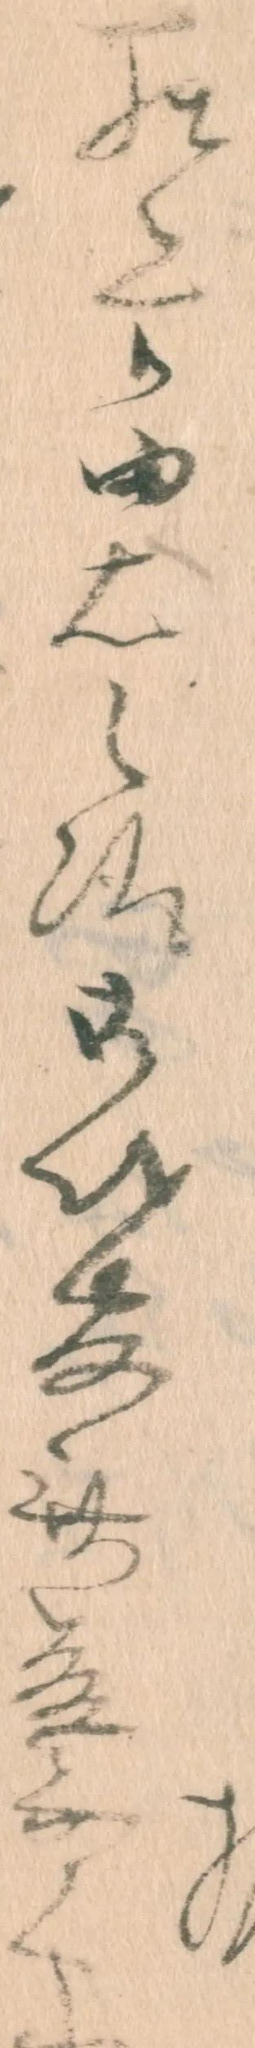罷在候由右之趣御代官斎藤市兵衛
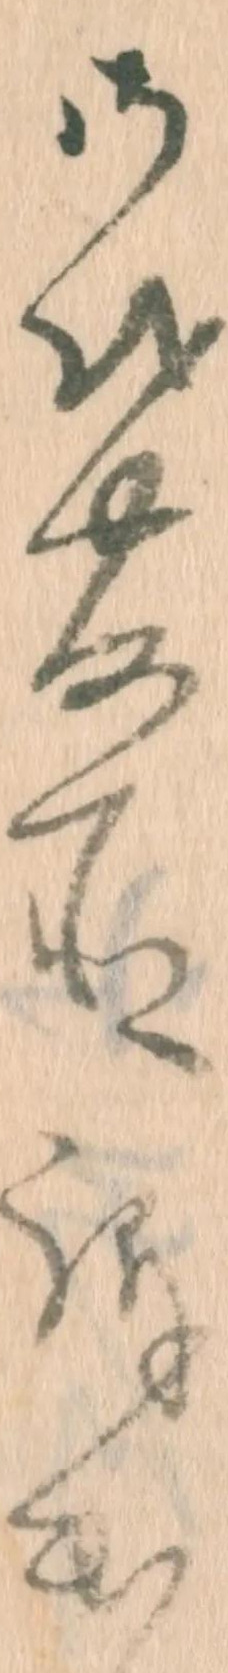御代官所訴出候
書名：地震災書留 2巻. [1] 内表紙に「地震災書留　安政二卯年　但本所深川御用屋敷地代免除調」とあり
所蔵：国立国会図書館 National Diet Library, JAPAN
